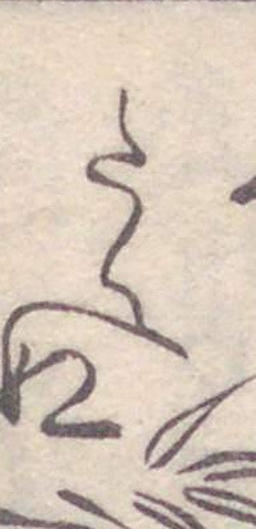たゝ？
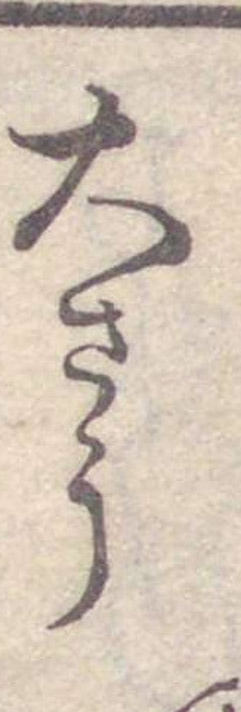大さう
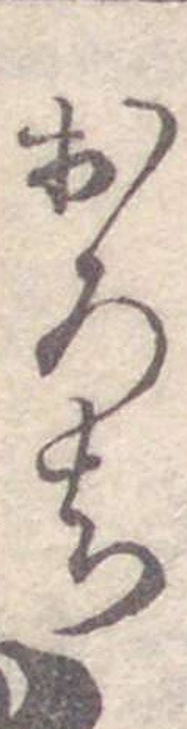おろち
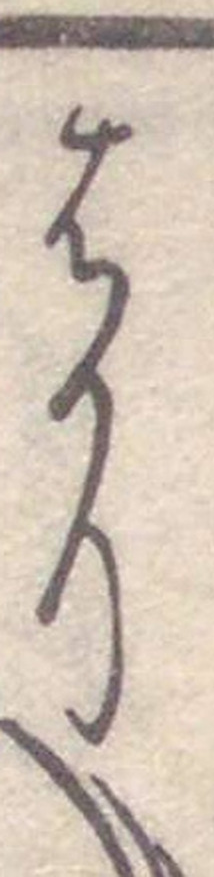はかり
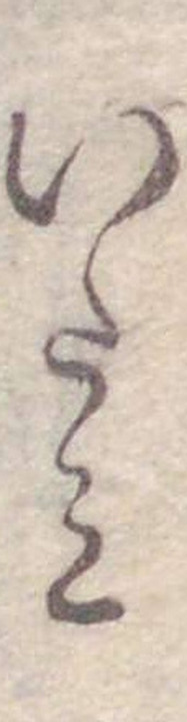いたみ

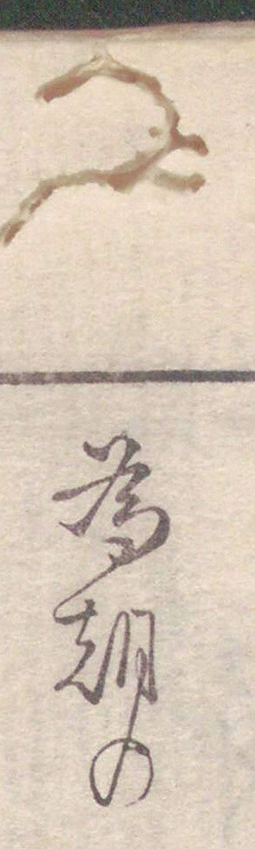為朝の
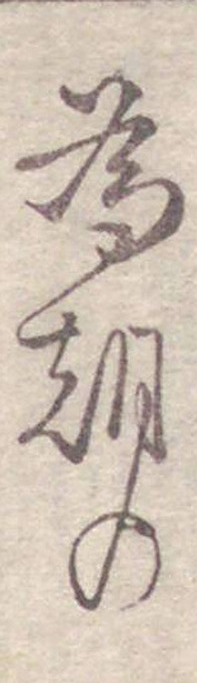為朝の
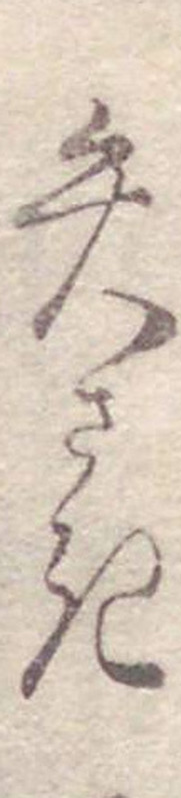矢さき
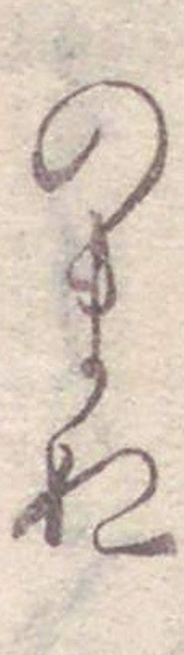のまぬ
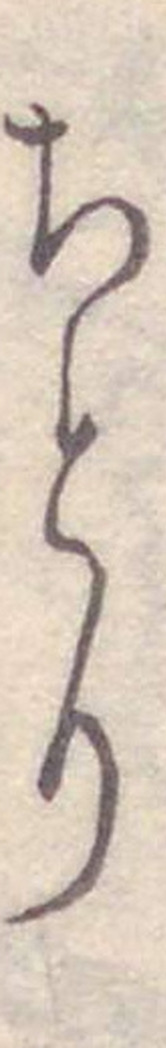ちとり
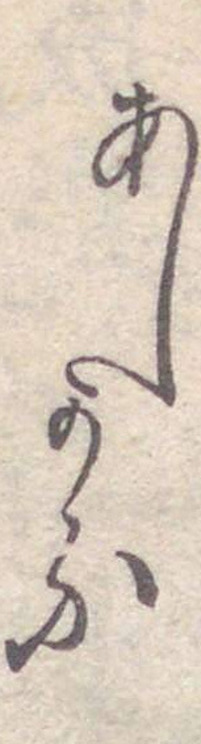あしかな
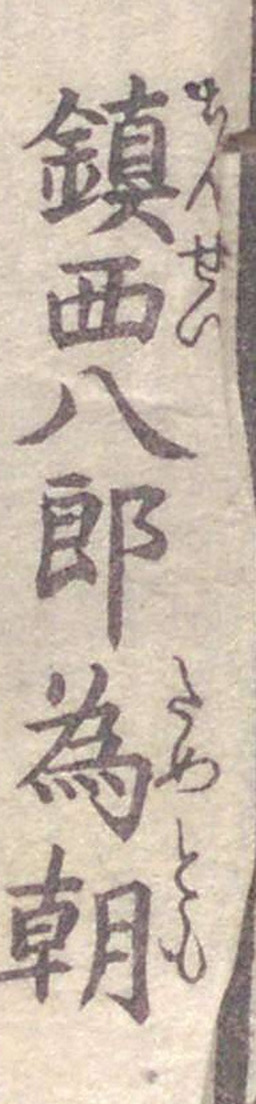鎮西八郎為朝
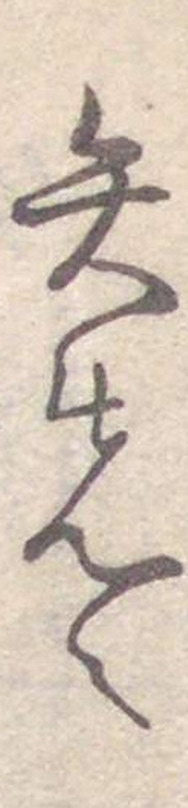矢先え
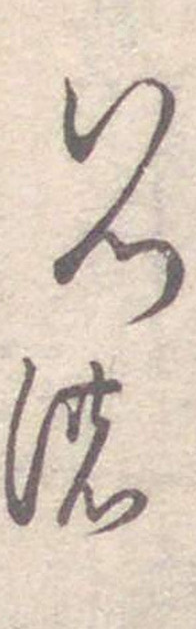いつの
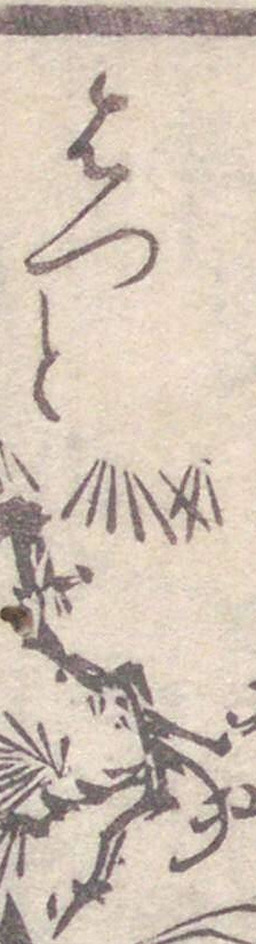はつと
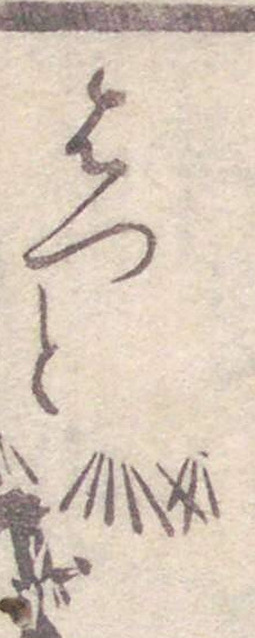はつと
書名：繪本八十宇治川
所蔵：九州大学中央図書館 国文学研究資料館
